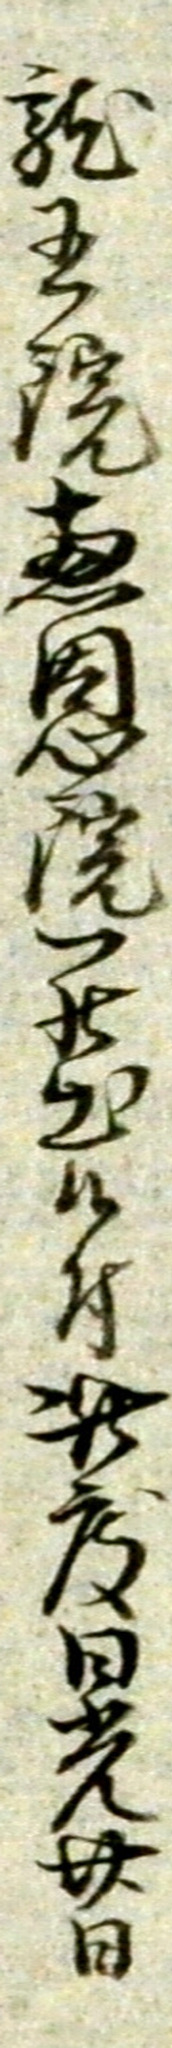龍王院恵恩院罷出候ニ付此度日光廿日
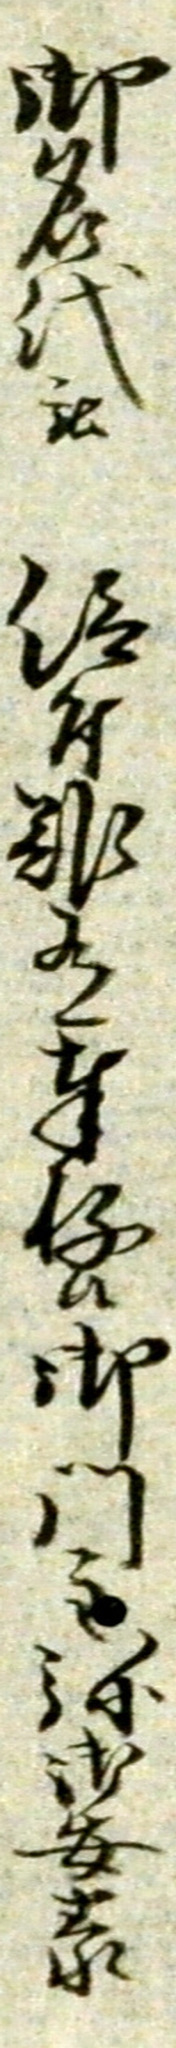御名代被仰付難有奉存候御門主弥御安泰
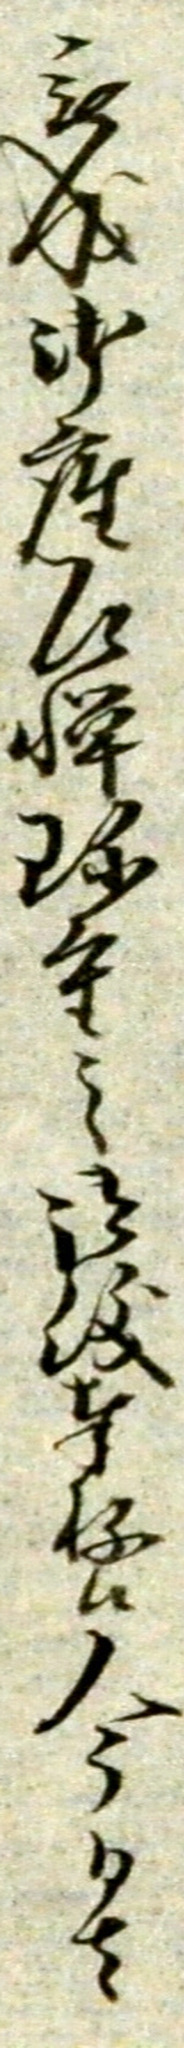被成御座乍憚珍重之御儀奉存候今日者
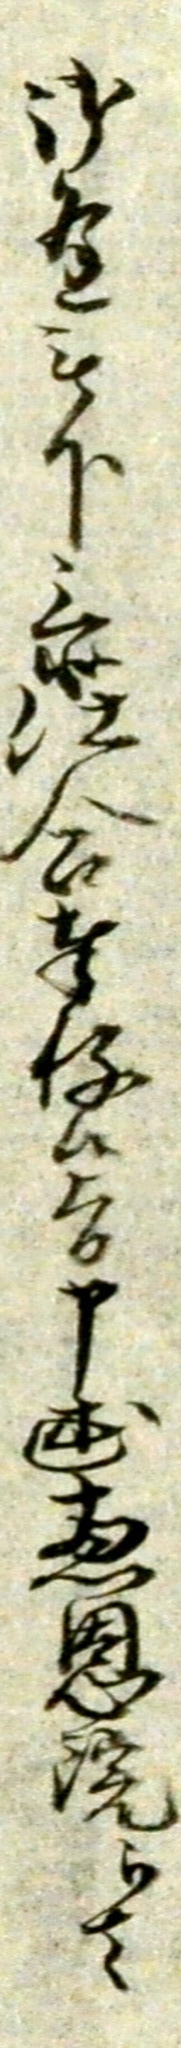御金被下忝仕合奉存候旨申述恵恩院江者
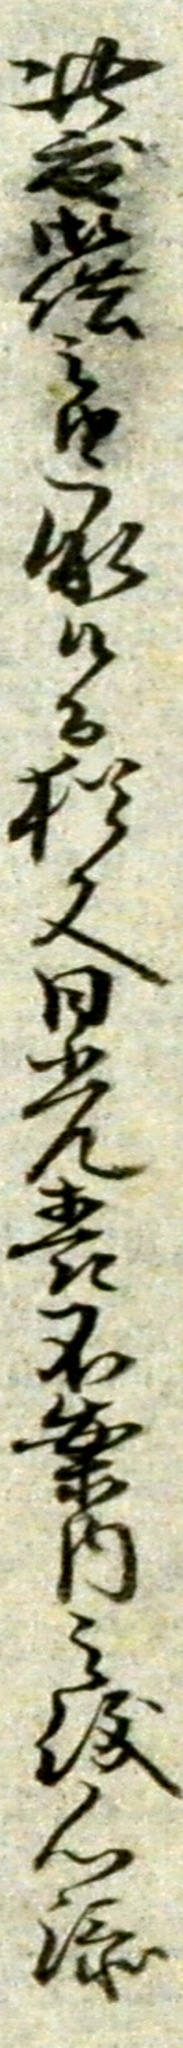此度御供之由承候而猶日光表不案内之儀心添
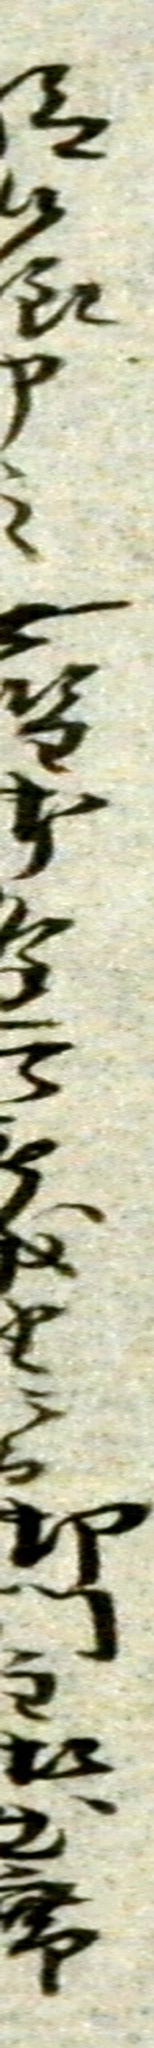賜候様申之無程御逢可被成由二而御門主御出席

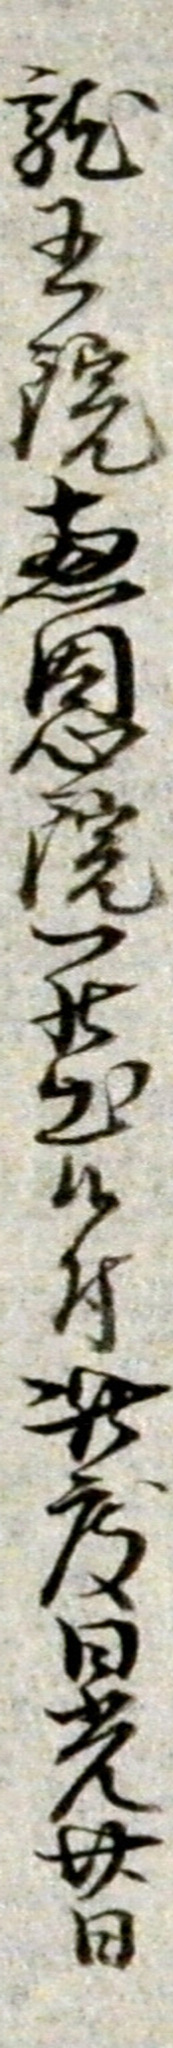龍王院恵御罷出候付此度日光廿日
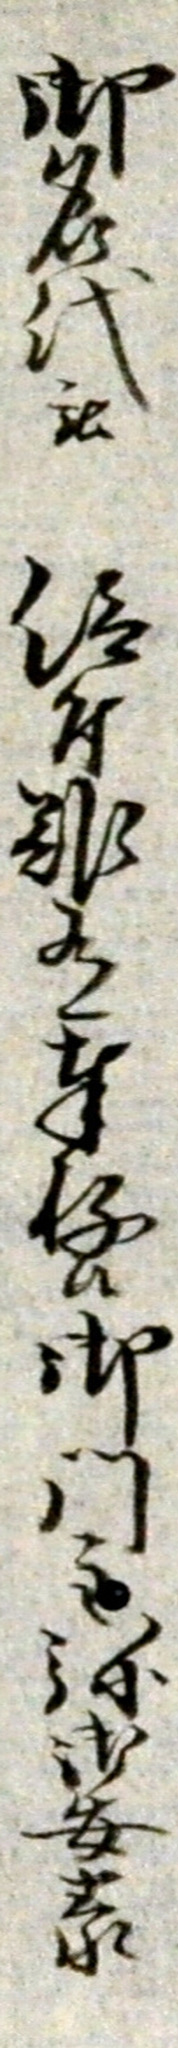御名代江仰付難有奉存候御門主弥御安泰
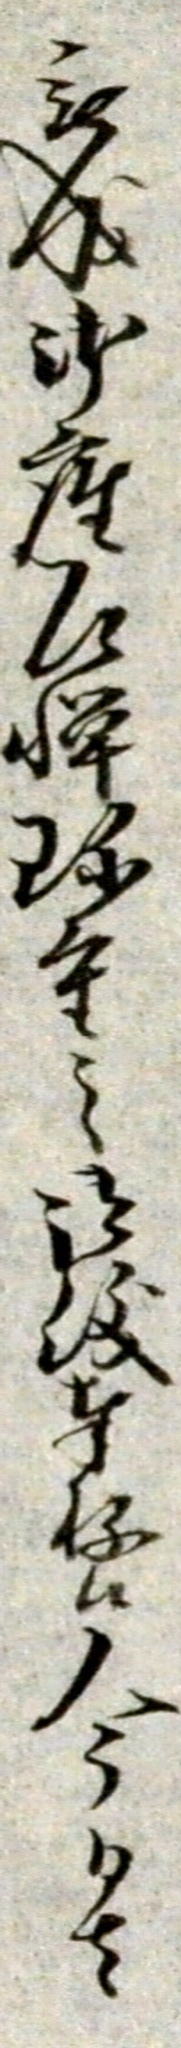被成御座乍憚珍重之御儀奉存候今日者
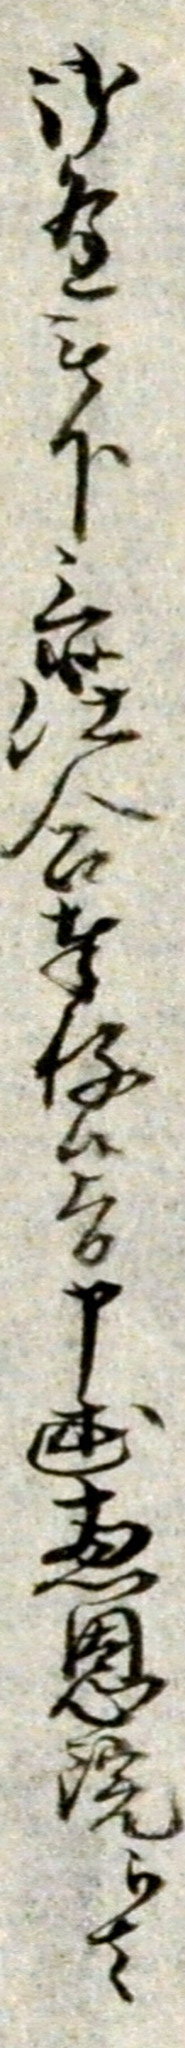御逢被下忝仕合奉存候旨申述恵御院江者
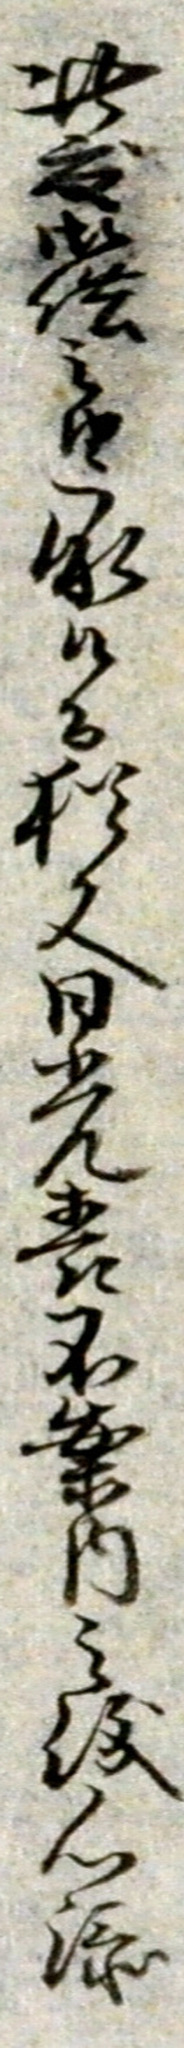此度御供之由承候而猶又日光表不案内之儀心添
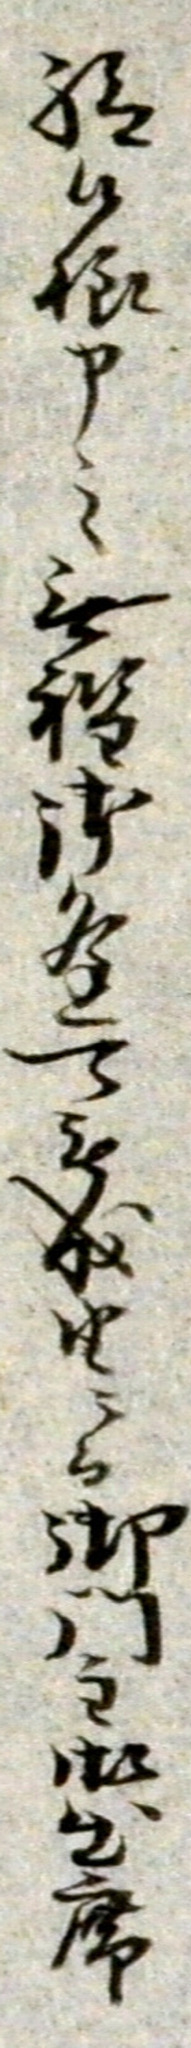給候様申之無程御逢可被成由ニ而御門主御出席
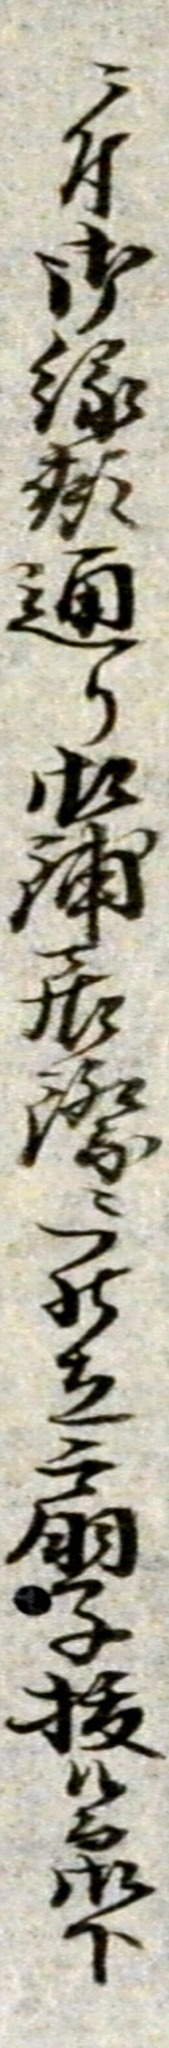ニ付御縁頬通り御鋪居際ニ罷在扇子抜候而御下
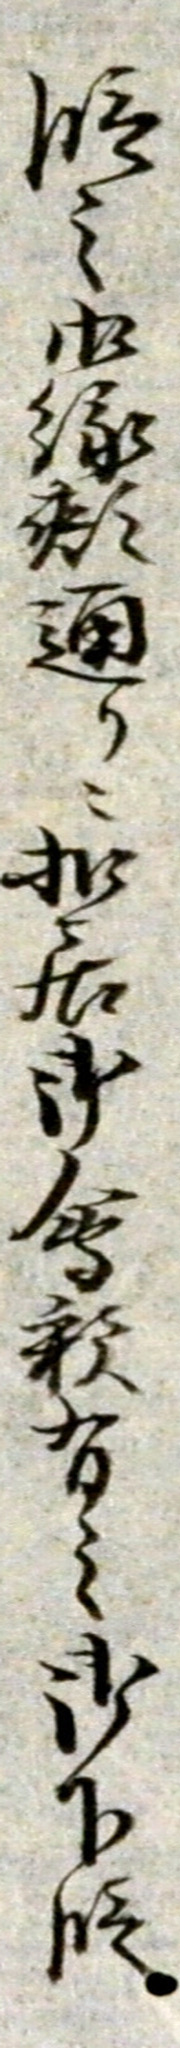段之御縁頬通りニ扣居御会釈有之御下段
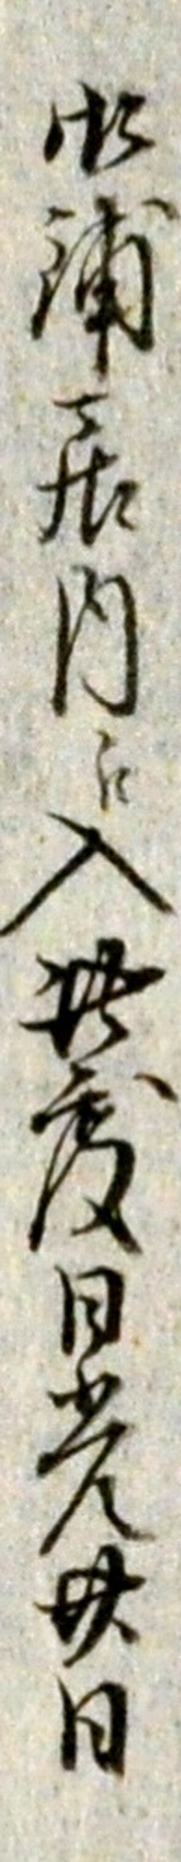御鋪居内江入此度日光廿日
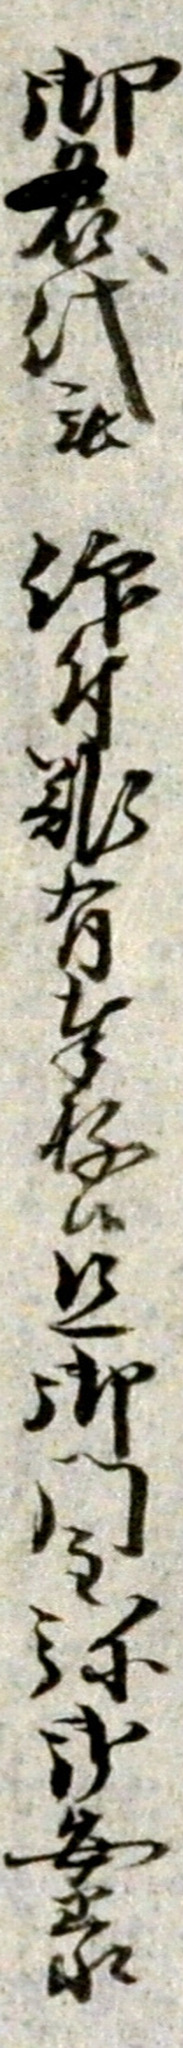御裏代被仰付難有奉存候且御門主弥御安泰
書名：日光御名代相勤候節ノ留
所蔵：伊那市立高遠町図書館・合同会社AMANE
